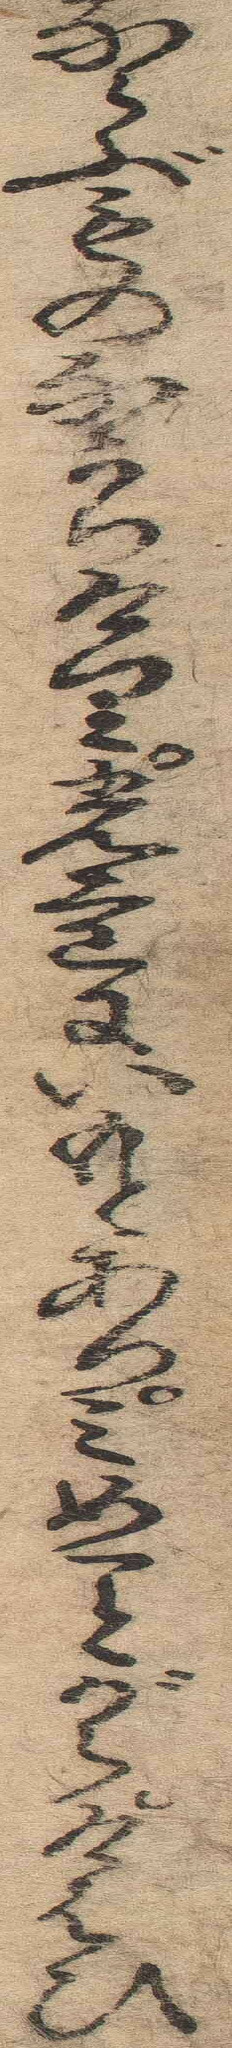ならぶものなかりけり。光遠にいもうとあり。みめことがらけはひ
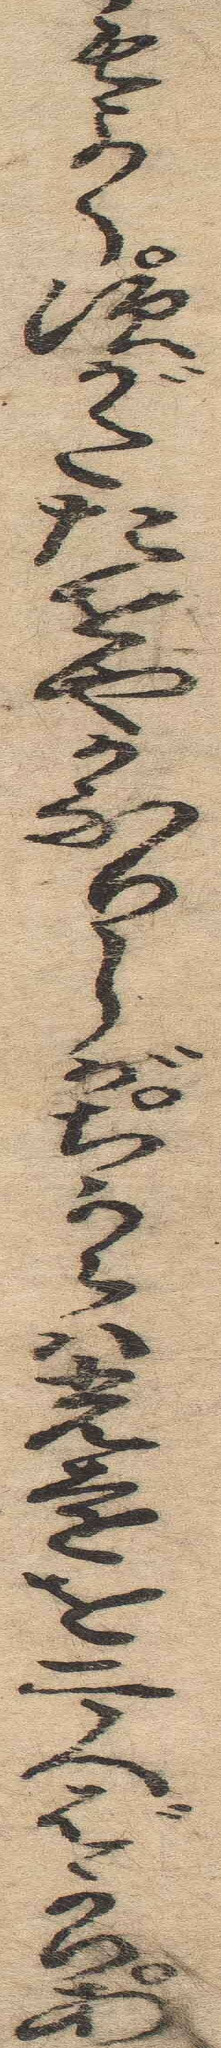もよく。すがたたをやかなりしが。ちからは光遠を二人ばかり。あ
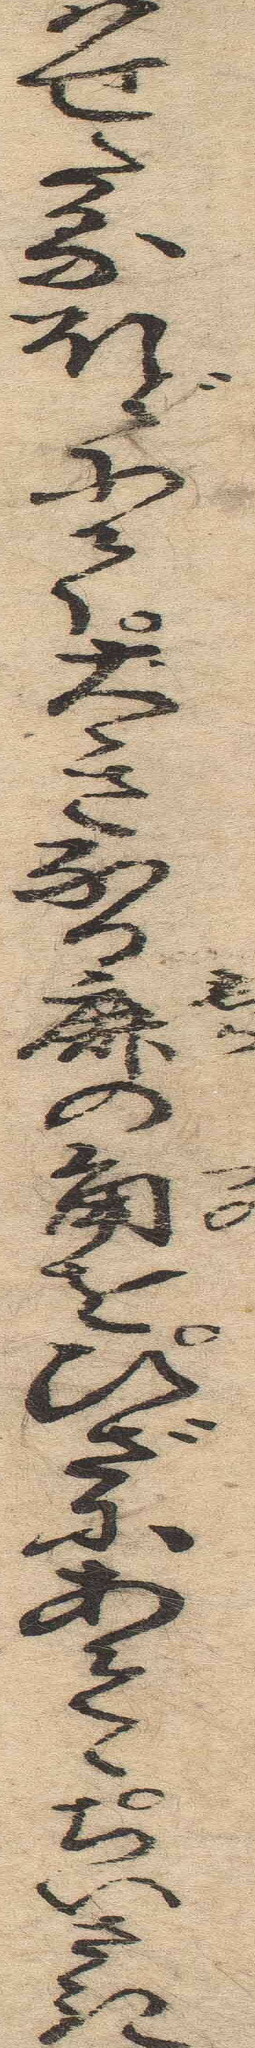はせたるほどにて。大きなる鹿の角を。ひざにあてゝ。ちいさき
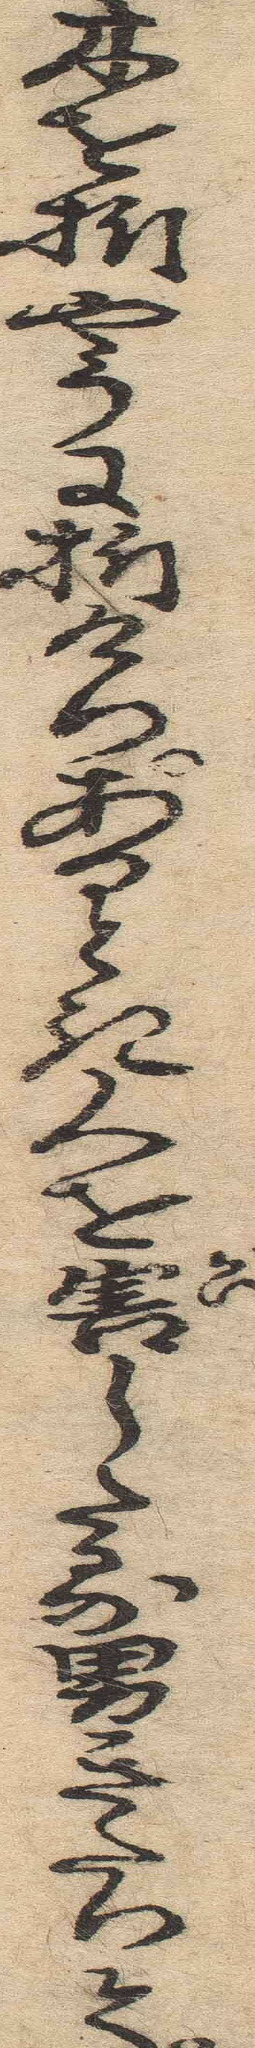木を折やうに折けり。あるとき人を害したる男きたりて。
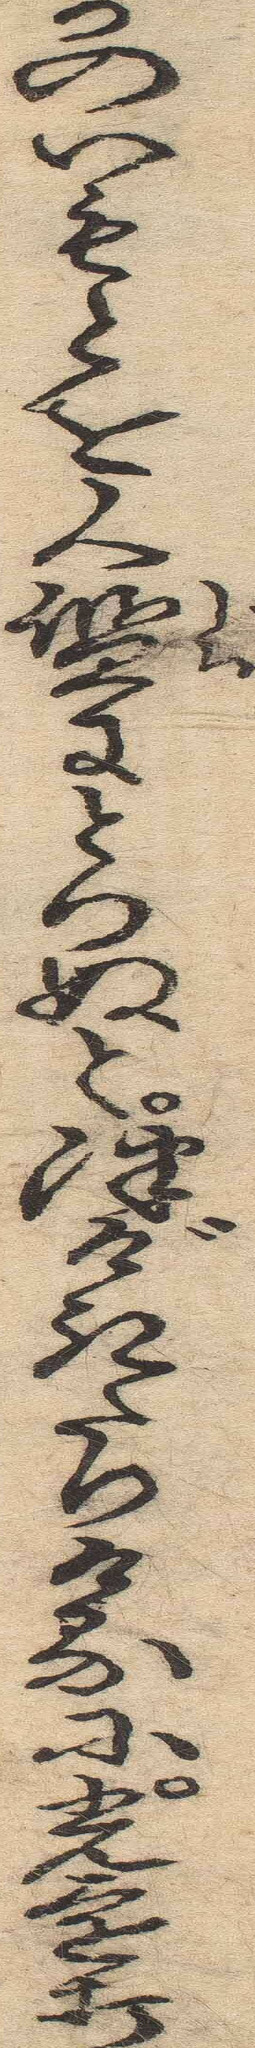かのいもとを人質にとりぬと。つげきたりけるに。光遠打
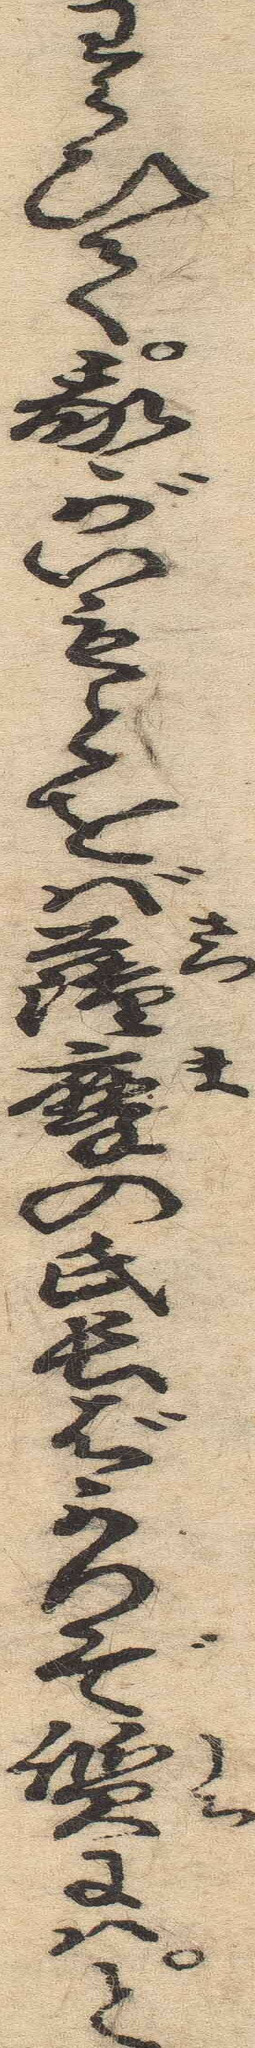わらひて。我がいもとをば薩摩の氏長ばかりぞ質には。と
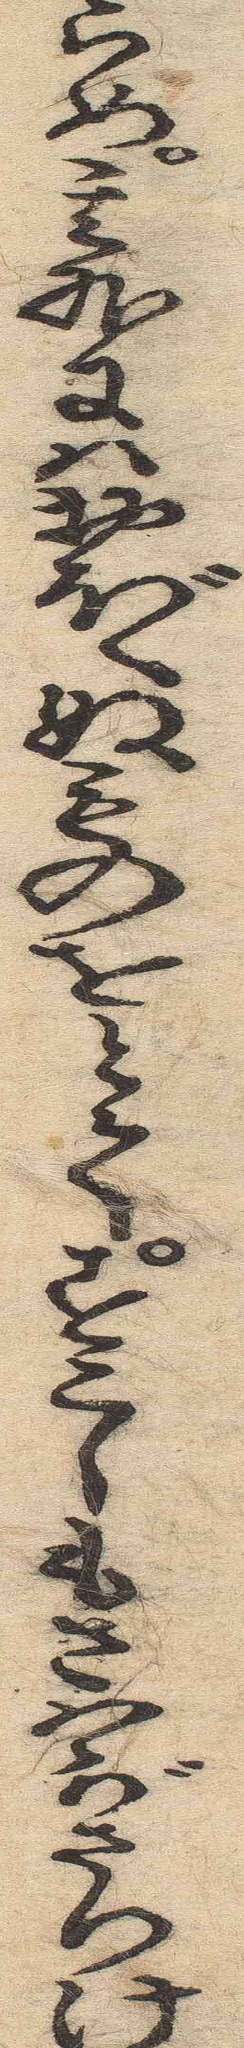らめ。其外にはおぼへぬものをとて。すこしもさはがざりけ
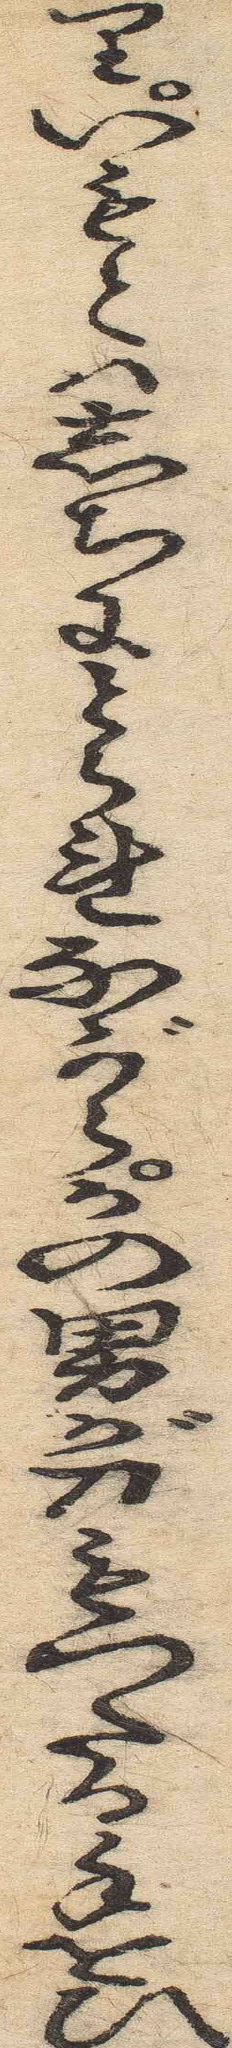り。いもとはしちにとられながら。かの男が刀もつたる手をひ
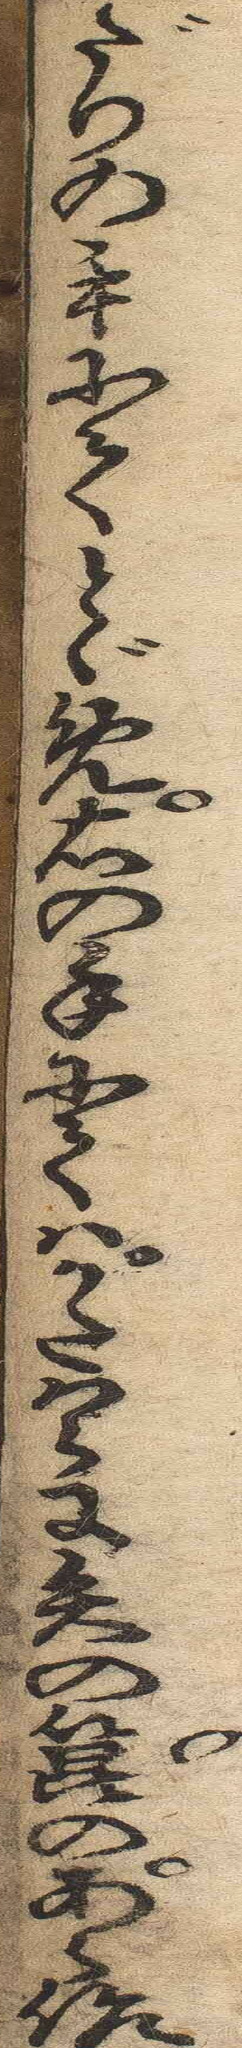ひだりの手にてとゞめ。右の手にては。かたはらはらに矢の箆の。あら作
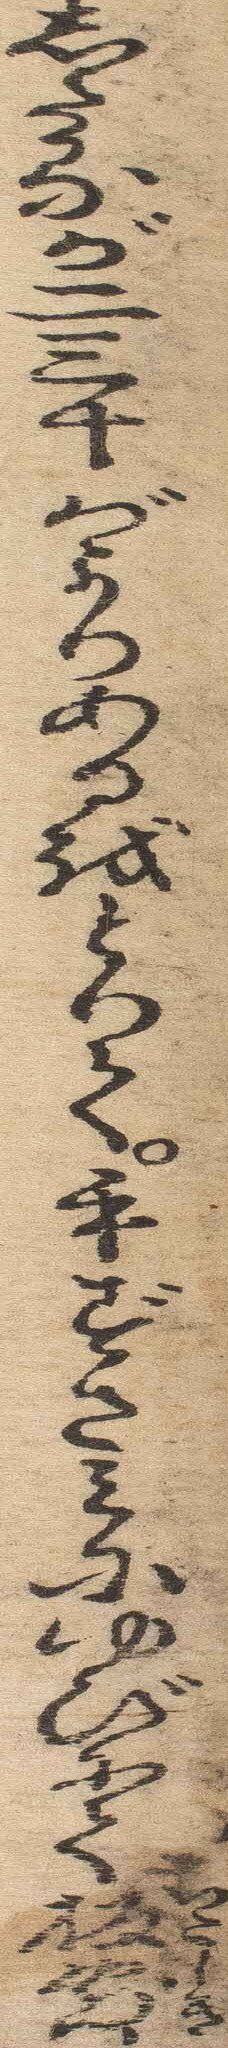したるが二三十ばかりあるをとりて。手ずさみにゆびにて板敷
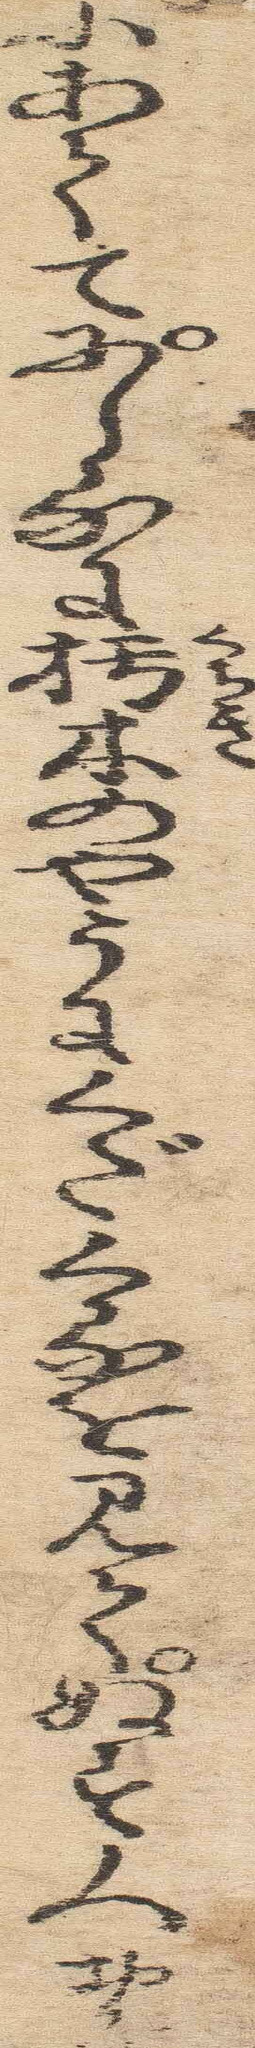にあてて。にしなに朽木のやうにくだくるを見てぬす人おそ
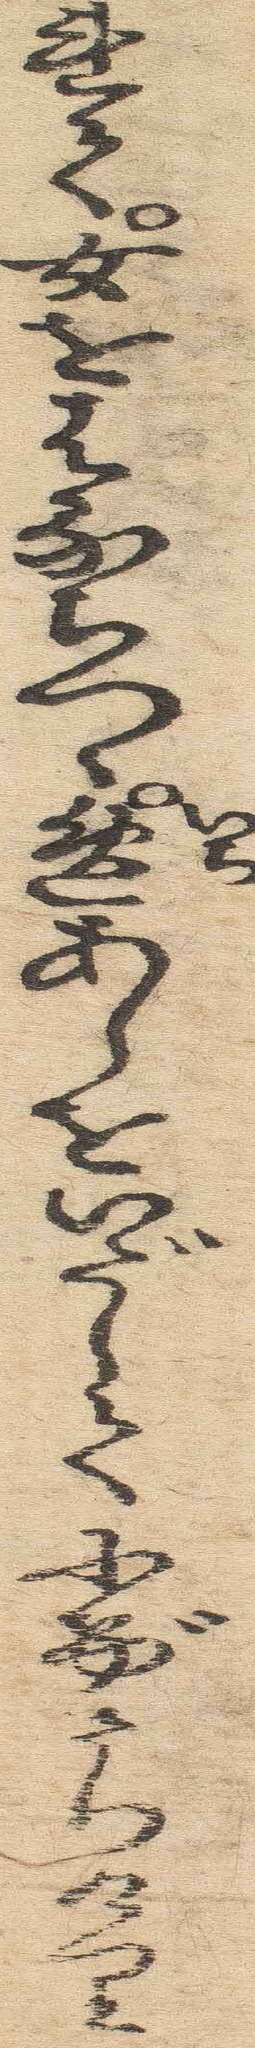れて。女をはなちつゝ。逸あしをいだしてにげさりけり
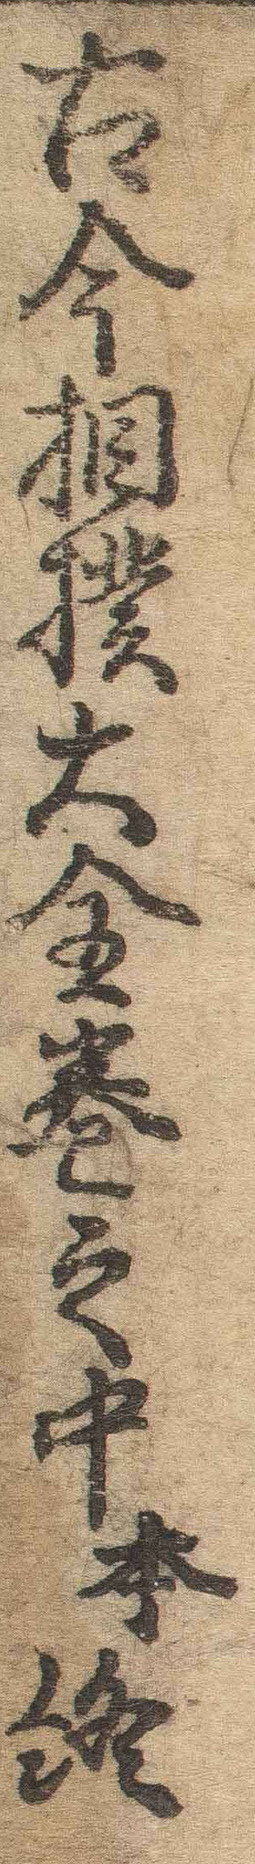古今相撲大全巻の中本終

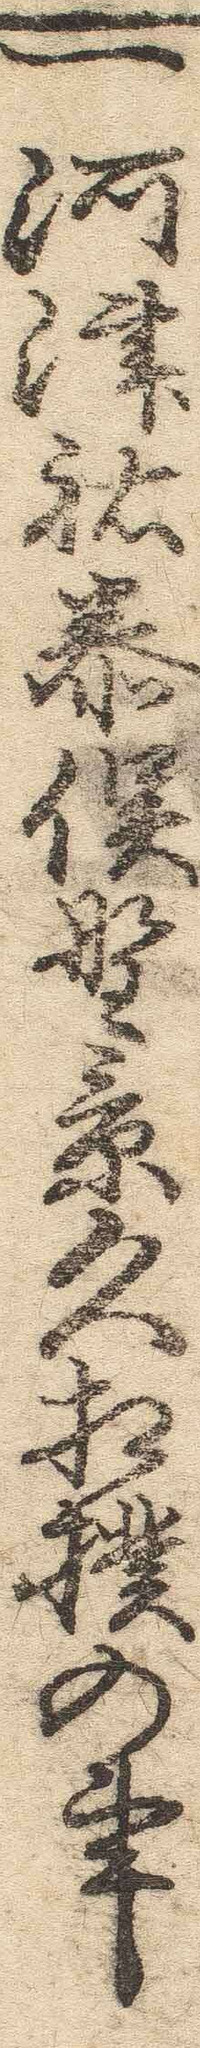一河津祐泰俣野景久相撲の事
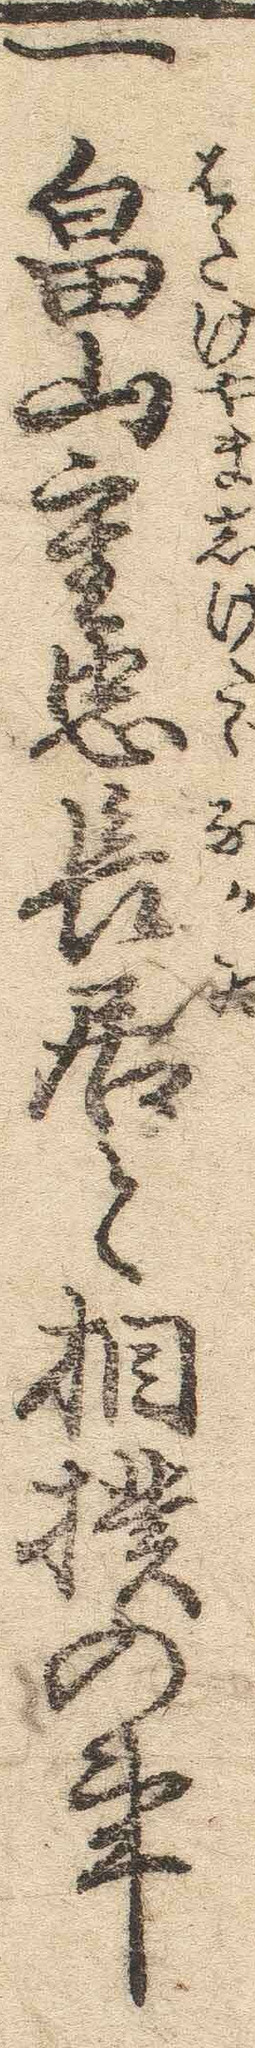一畠山重忠長居と相撲の事
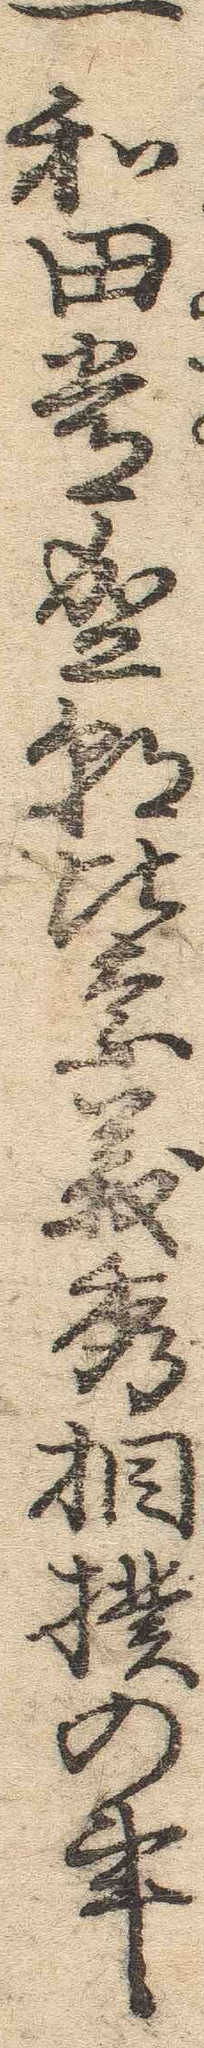一和田常盛朝比奈義秀相撲の事
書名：古今相撲大全
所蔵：東京学芸大学附属図書館 国文学研究資料館
